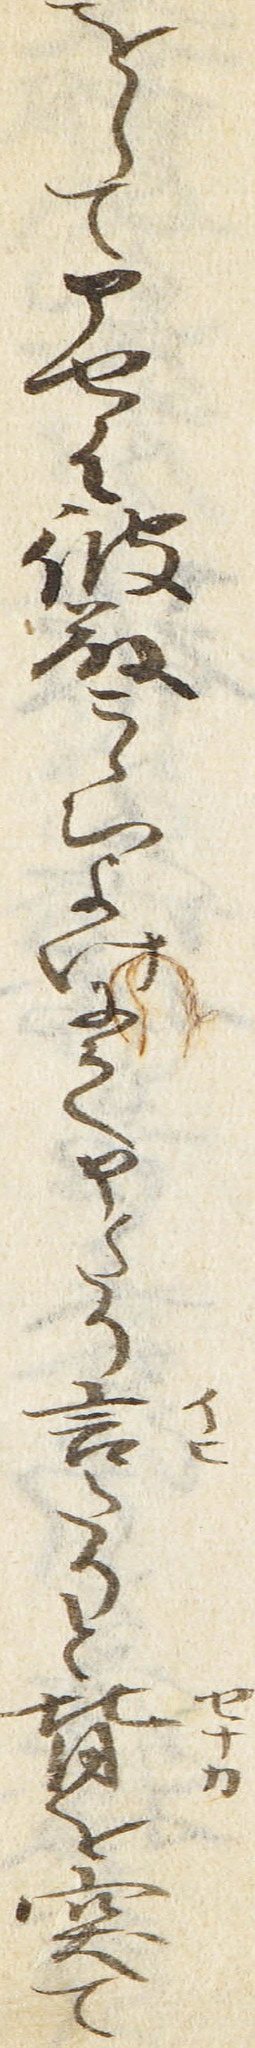をして申せは彼藤こゝちよけにて申たり言たりと背を突て
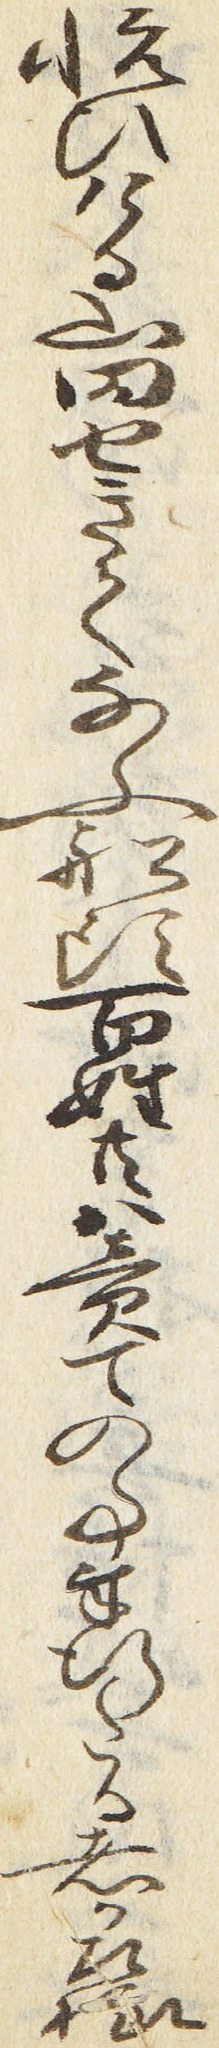悦ひける山田せきてなふ船頭百姓共は責ての事奉行たる者か左様
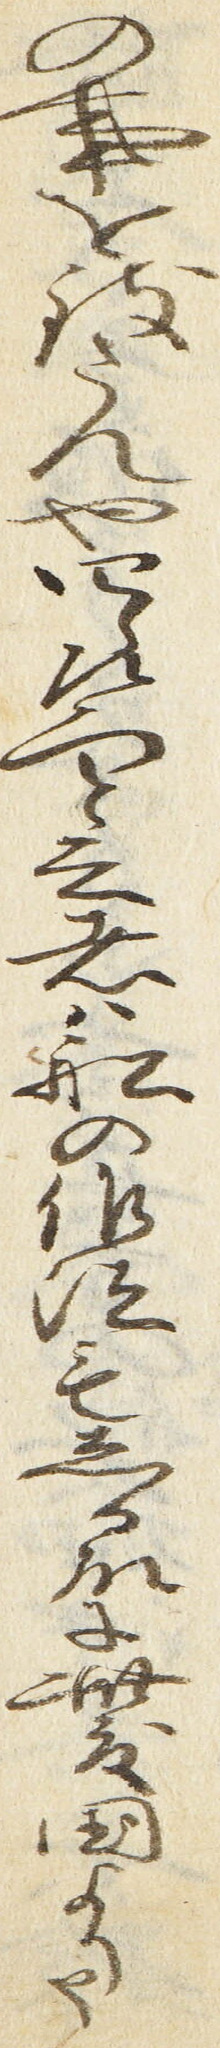の事を致さんや四郎左衛門と云者は船の作法もしる故に此度国より申

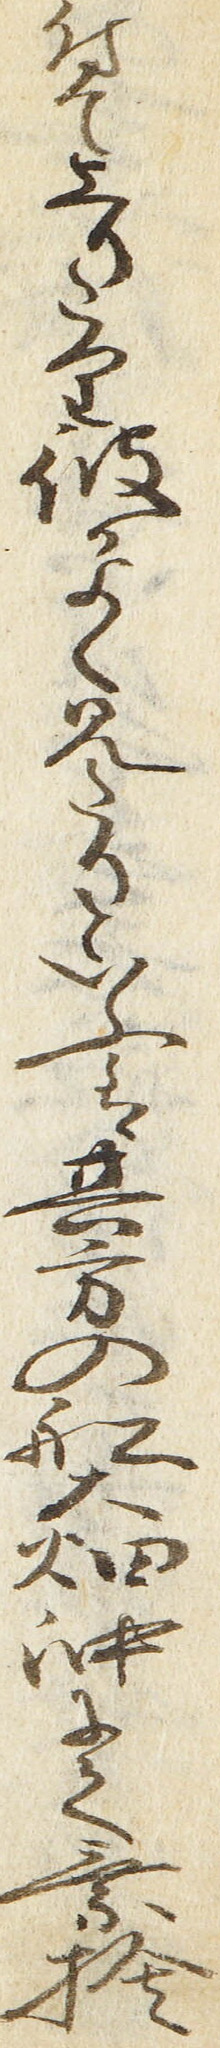付て上りたり彼かよく見たりといふは其方の船大畑沖にて乗捨
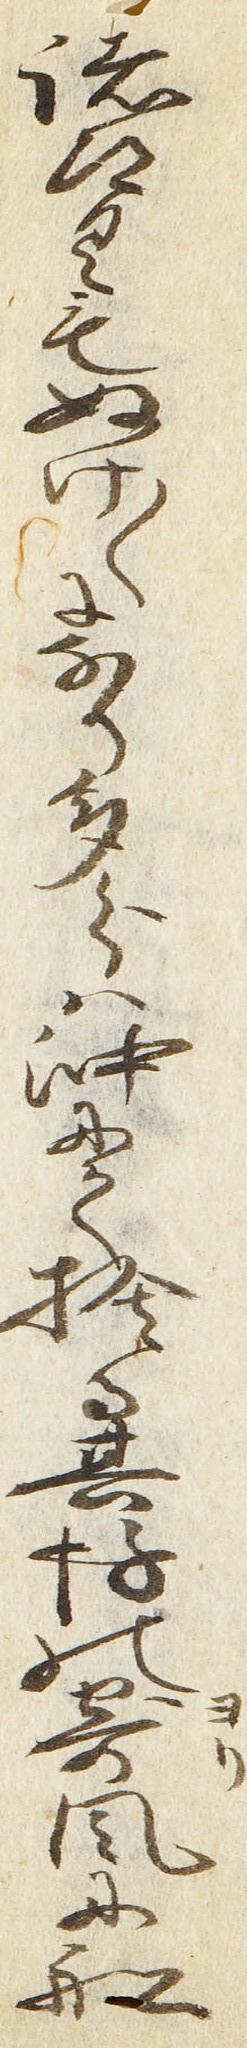諸道具もぬけ〳〵になり多分は沖にて捨る其後の寄風に船
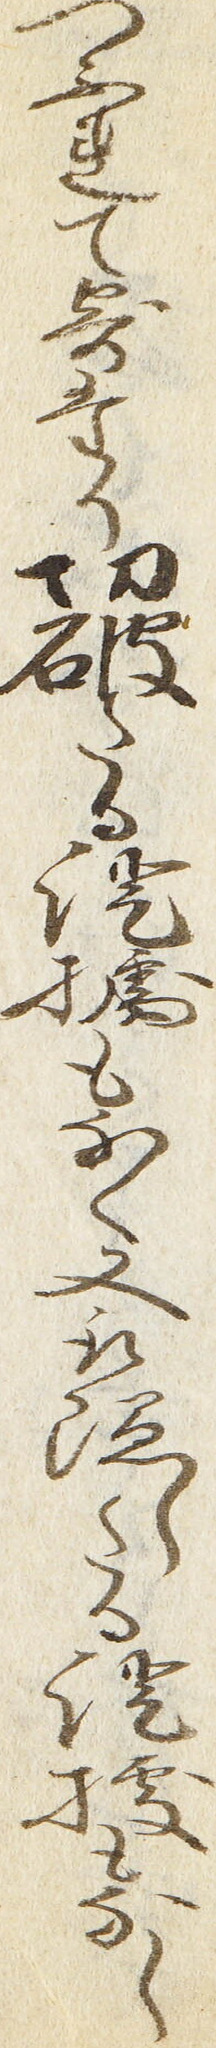つふれて寄たり切破たる証拠もなく又取隠したる証拠もなし
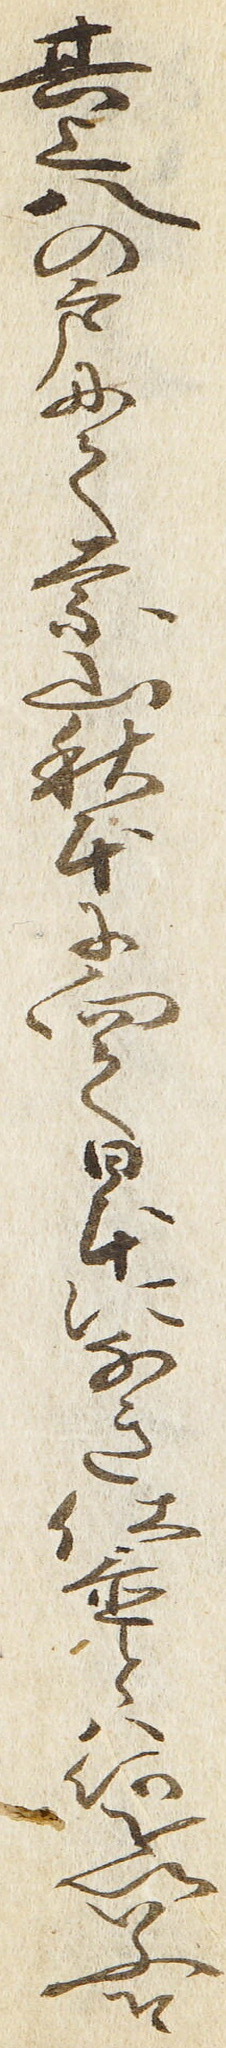其上八の戸にて奈山秋本に向て日本になき仕置とは何を以いふそ
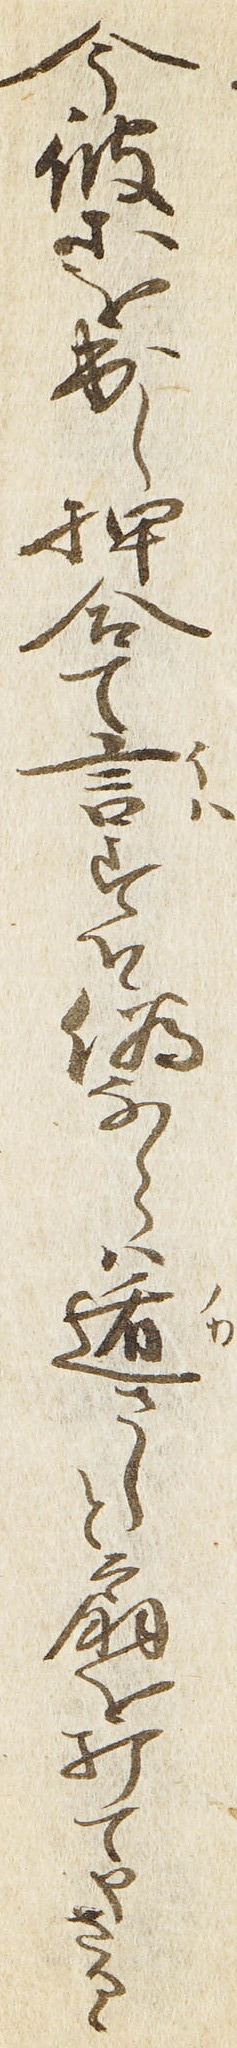今彼等を出し押合て言すそ偽ならは遁さしと扇を打て申さるゝ
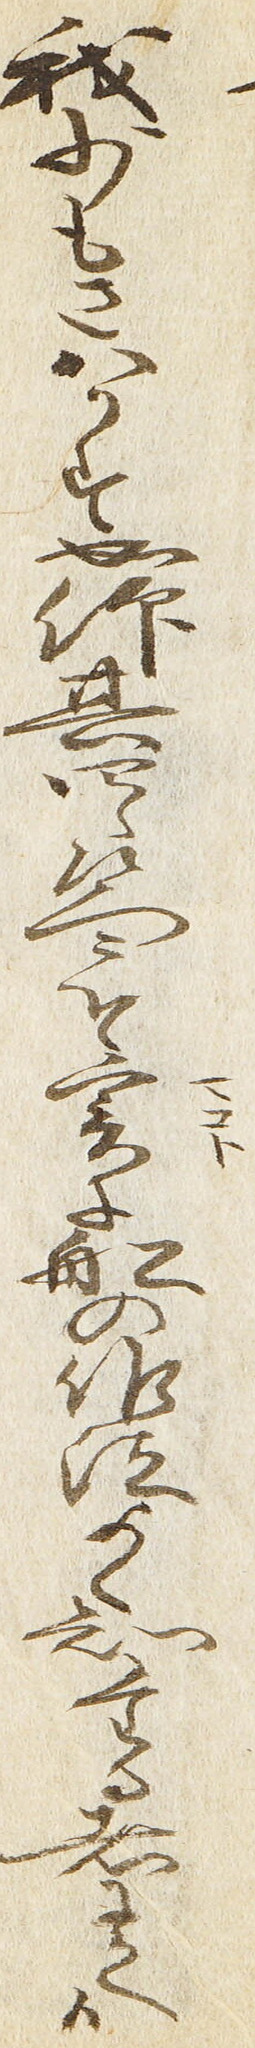我少もさはかす如仰其四郎左衛門こそ実に船の作法よく知たる者にて候
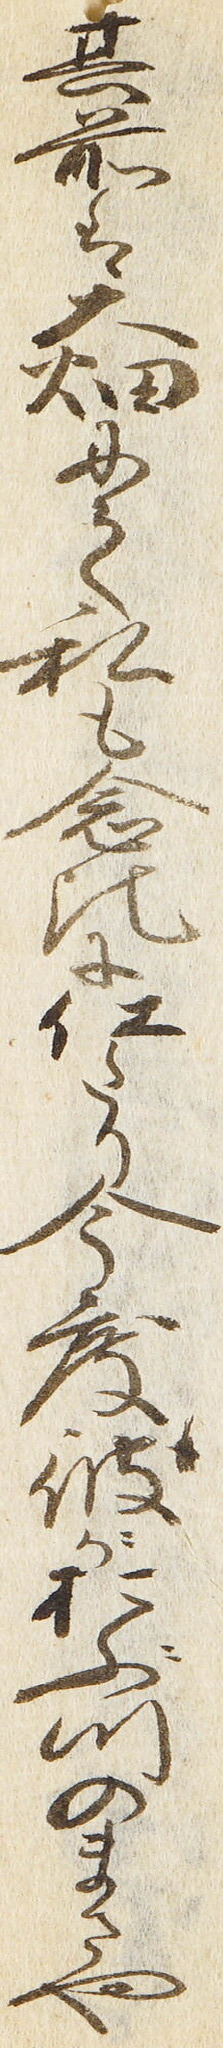其前は大畑にて私も念頃に仕たり今度彼がおぶ川のまさや
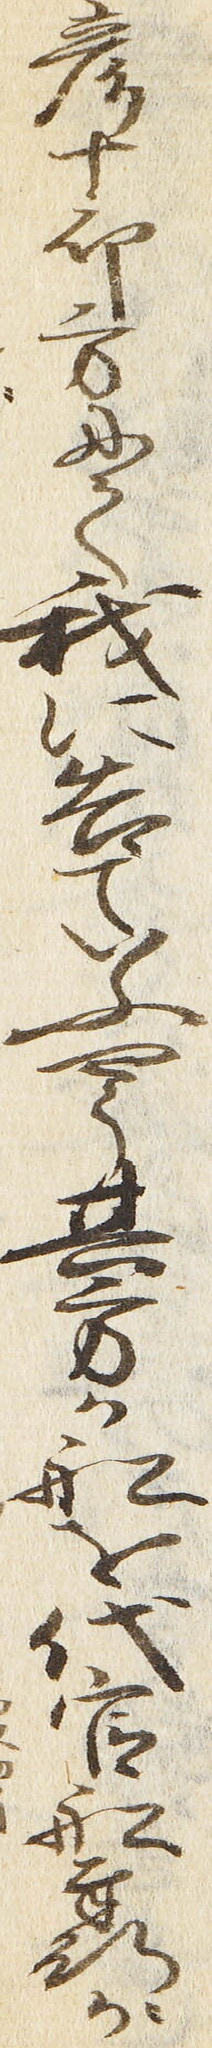彦十郎方にて我に告ていふやう其方か船を代官船奉行が
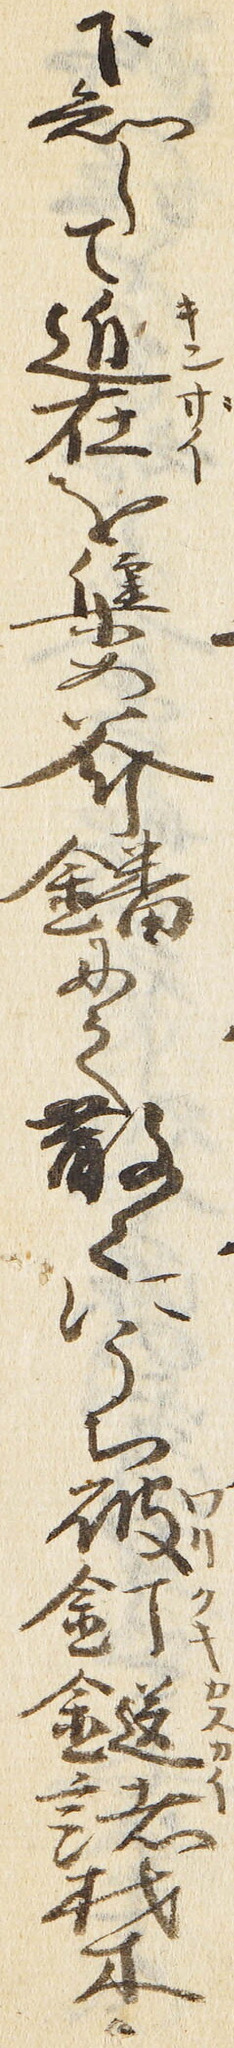下知して近在を集め斧鐇にて散々にうち破釘鎹諸材木
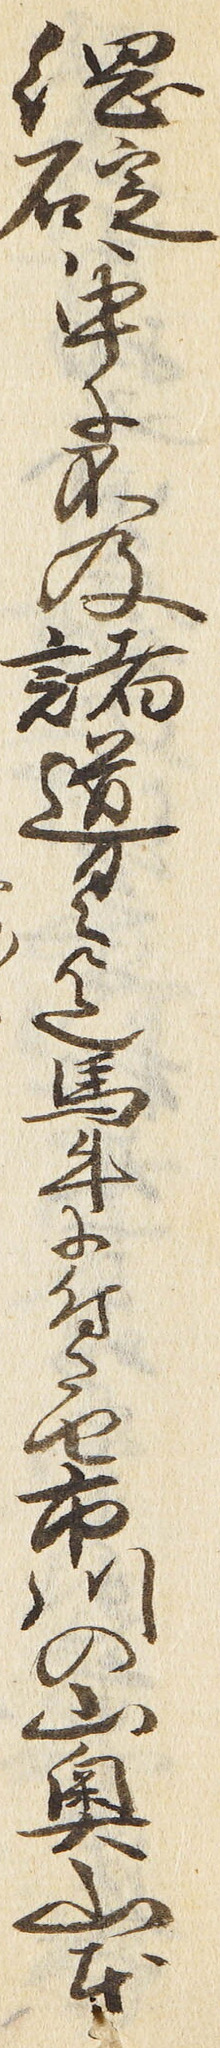綱碇は申に不及諸道具迄馬牛に付させ市川の山奥山本
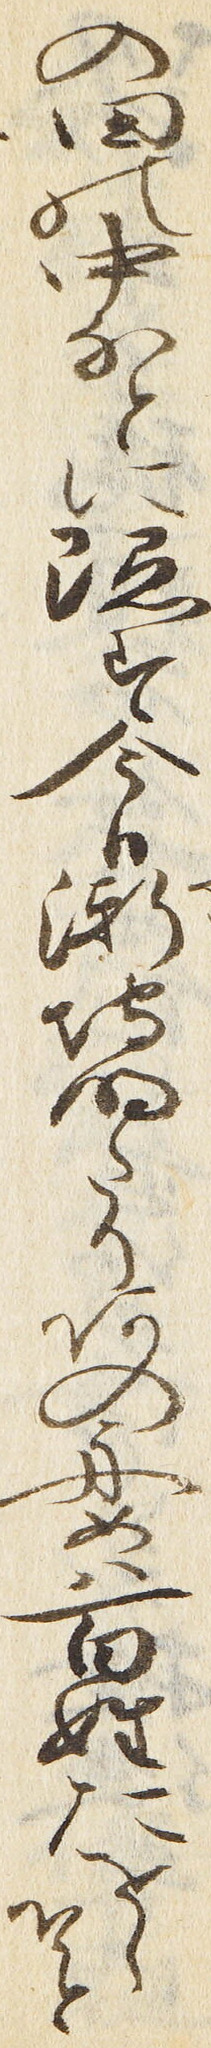の田の中なとに隠す今日漸埒明たりあの舟めは百姓たをしそと
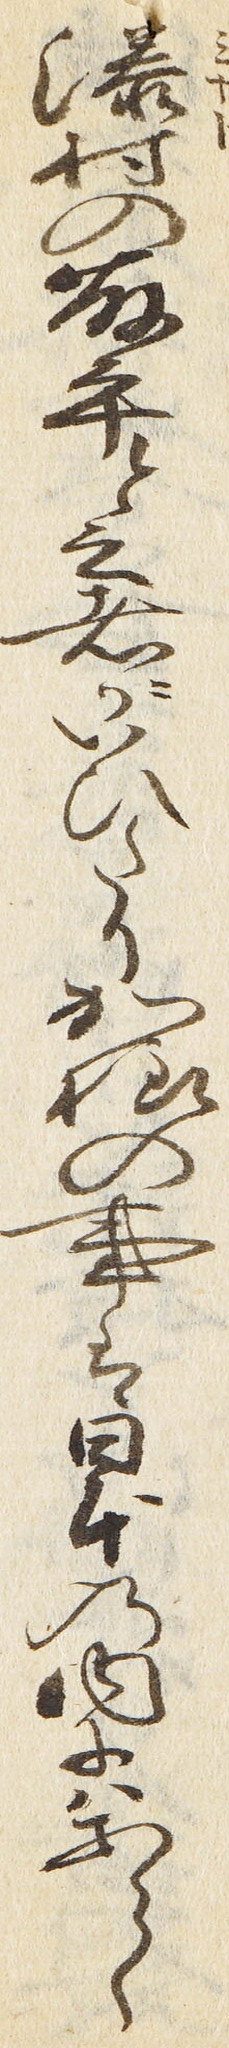湊村の藤平と云者がいひたりか様の事は日本の内にはあらし
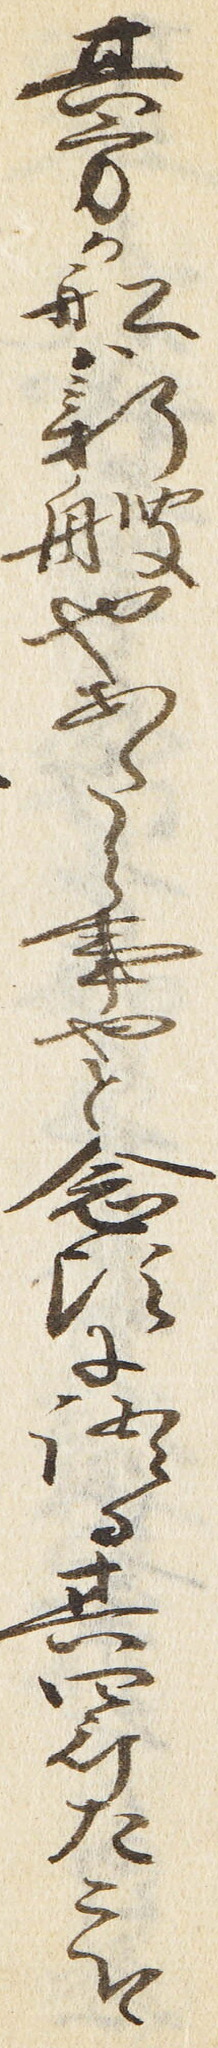其方か船は新艘やあたら事やと念頃に語る其四郎左こそ
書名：海陸世話日記
